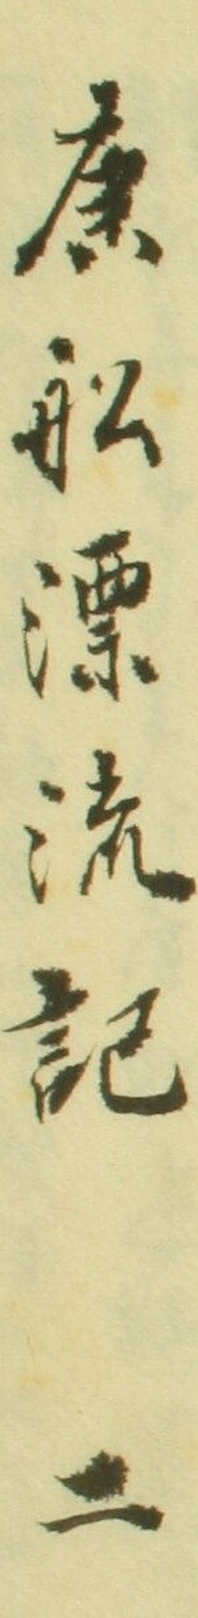唐船漂流記二

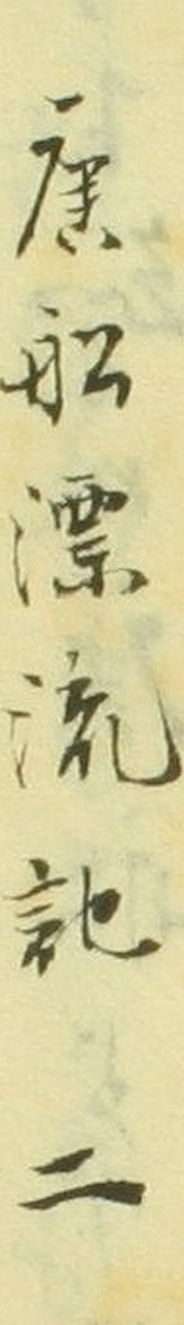唐船漂流記二
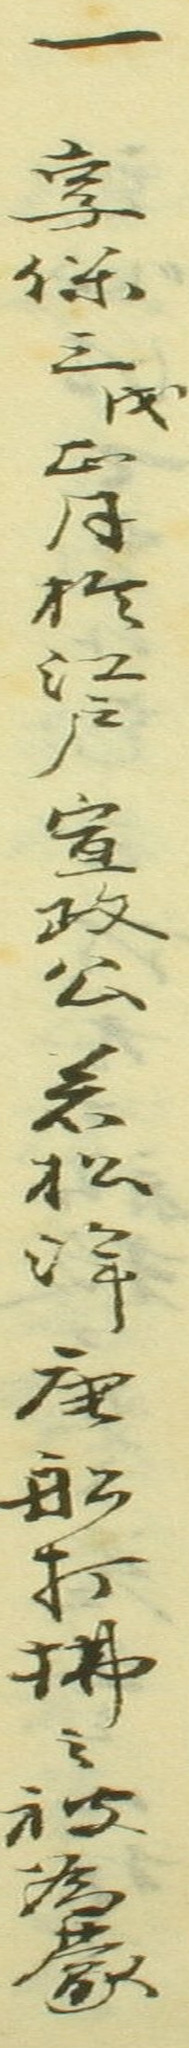一享保三戌正月於江戸宣政公若松洋唐船打払之被為蒙
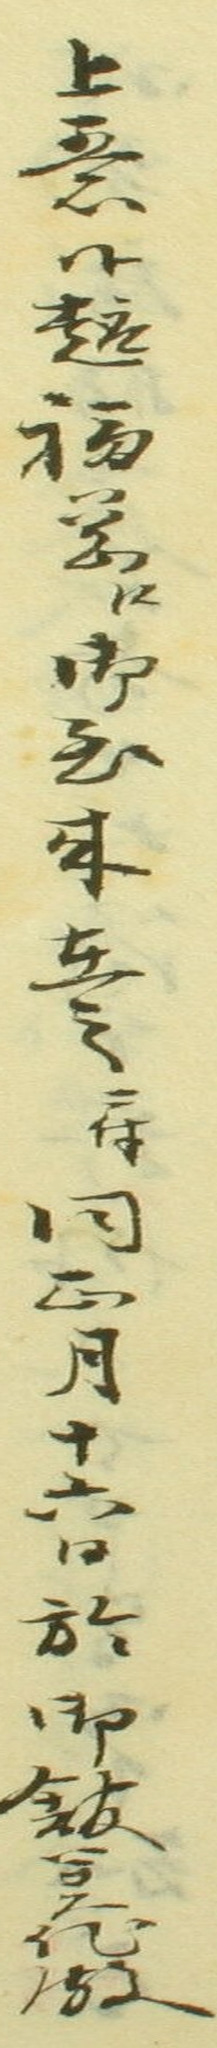上意候趣福岡江御到来在之ニ付同正月十六日於御館美作殿
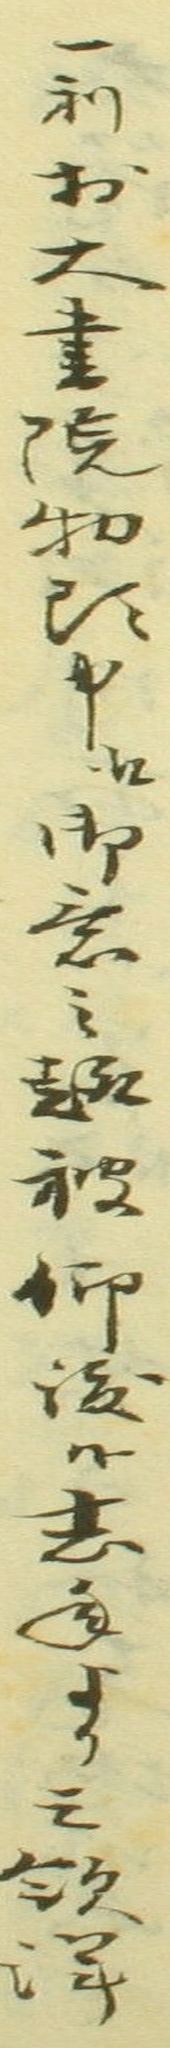一利於大書院物頭中江御意之趣被仰渡候去年より三領洋
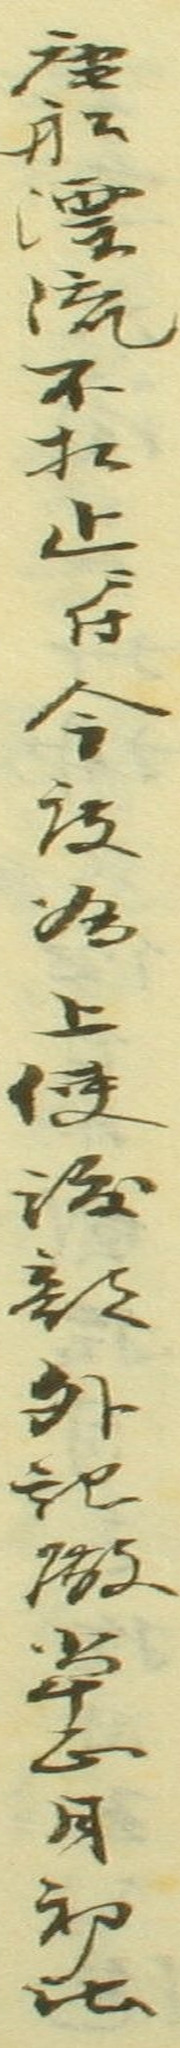唐船漂流不相止ニ付今度為上使渡部外記殿当正月初頃
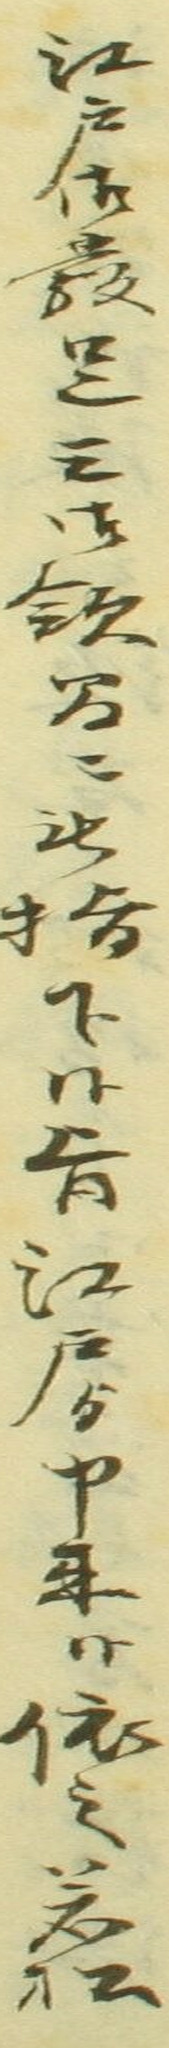江戸御発足三御領間ニ被指下候旨江戸ゟ申来候依之若松
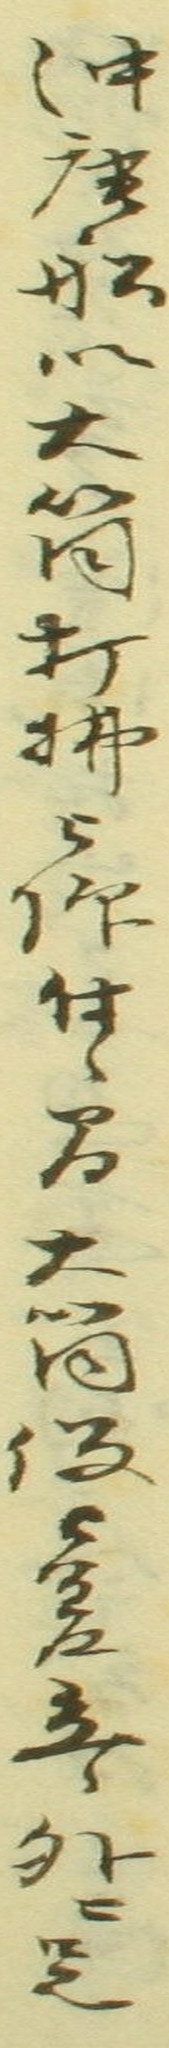沖唐船以大筒打払被仰付候間大筒役被差立候外ニ足
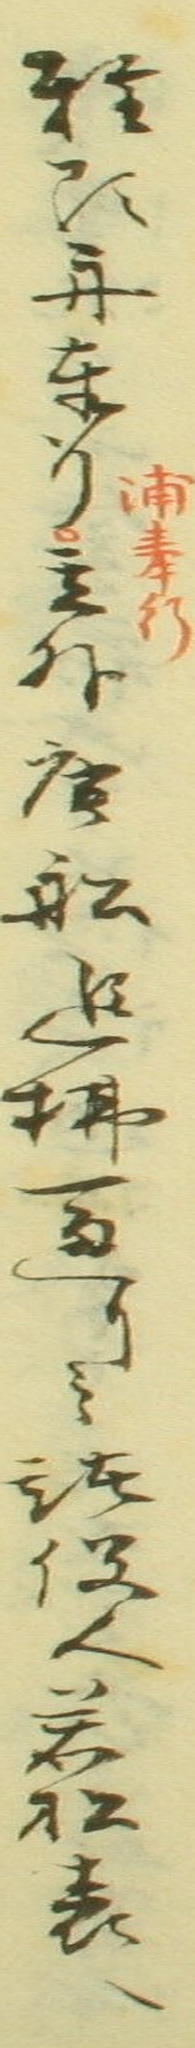軽頭舟奉行其外唐船追払一通り之諸役人若松表へ
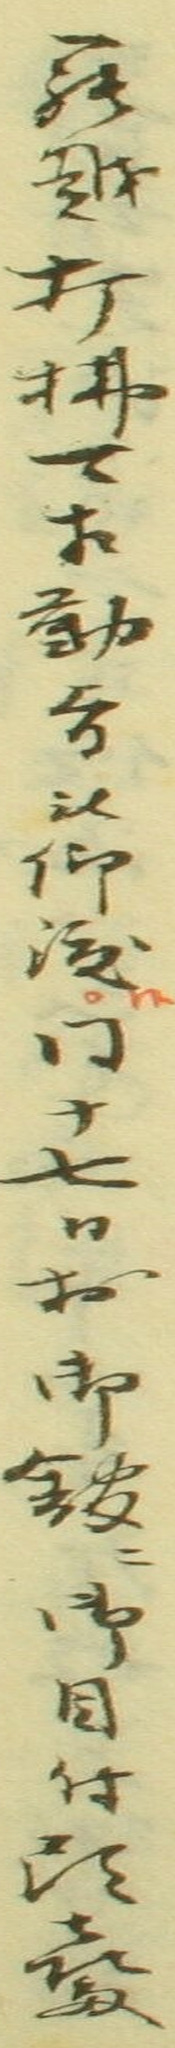罷越打払可相勤旨被仰渡同十七日於御館ニ御目付頭喜多
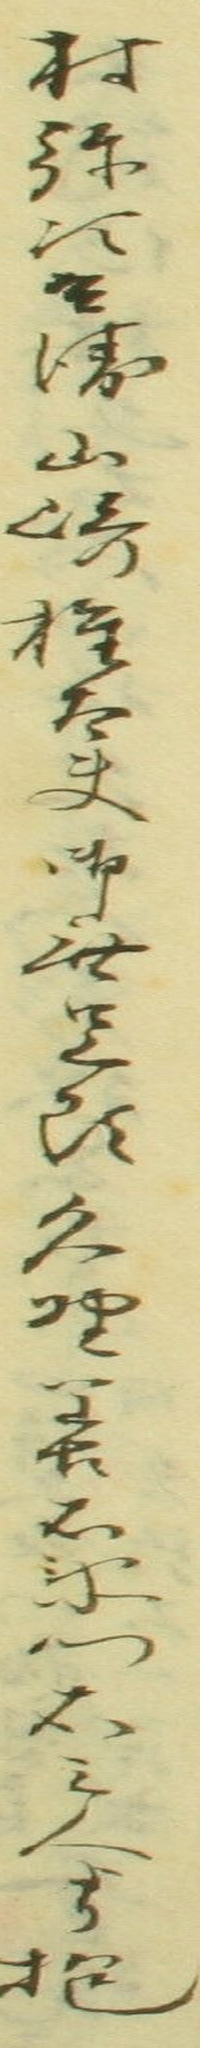村弥次兵衛山崎権太夫御無足頭久野善右衛門右三人より抱

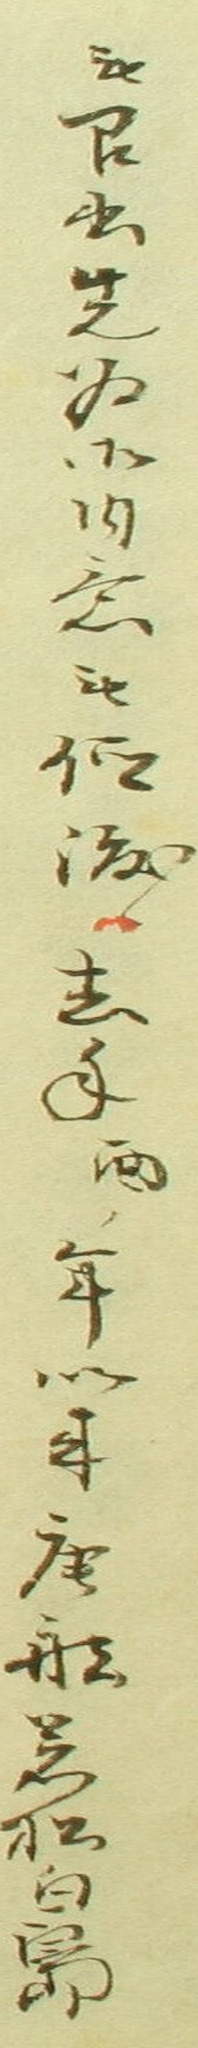被召出先為御内意被仰渡候去年酉ノ年以来唐船若松白島
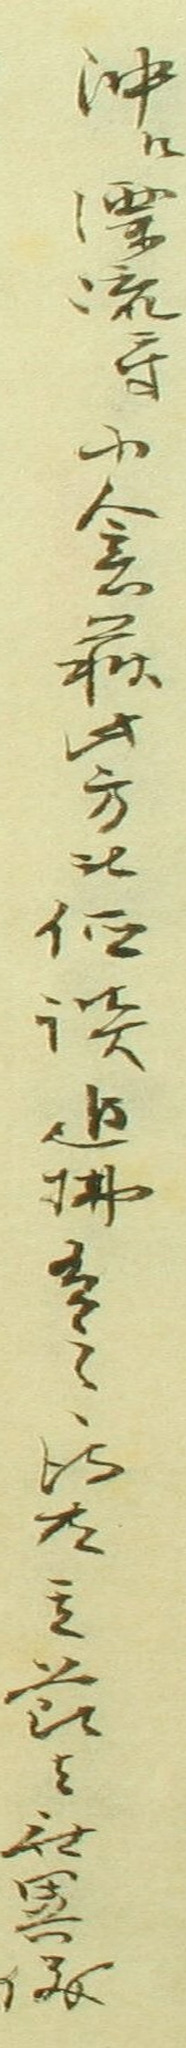沖江漂流ニ付小倉萩此方被仰談追払有之候得共其節は無異儀
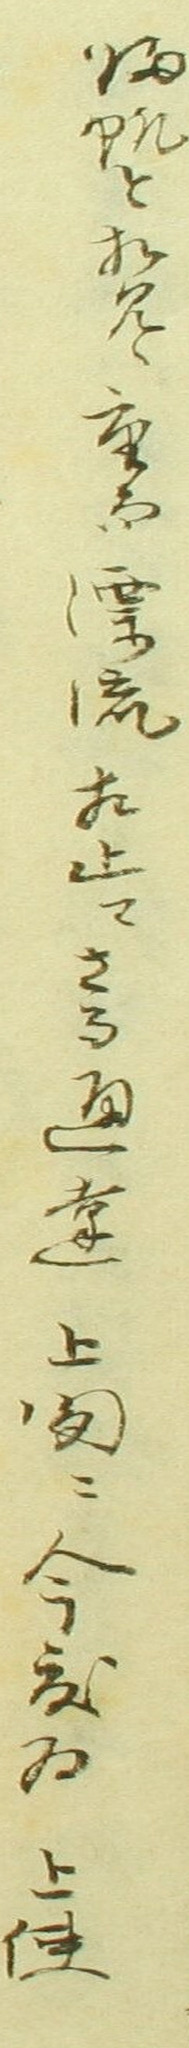帰帆と相見へ重而漂流相止てさる通達上聞ニ今度為上使
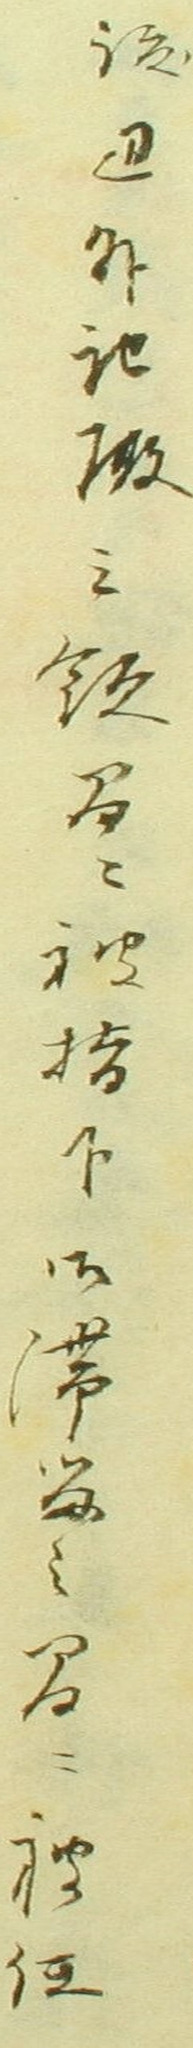渡辺外記殿三領間ニ被指下御滞留之間ニ被任
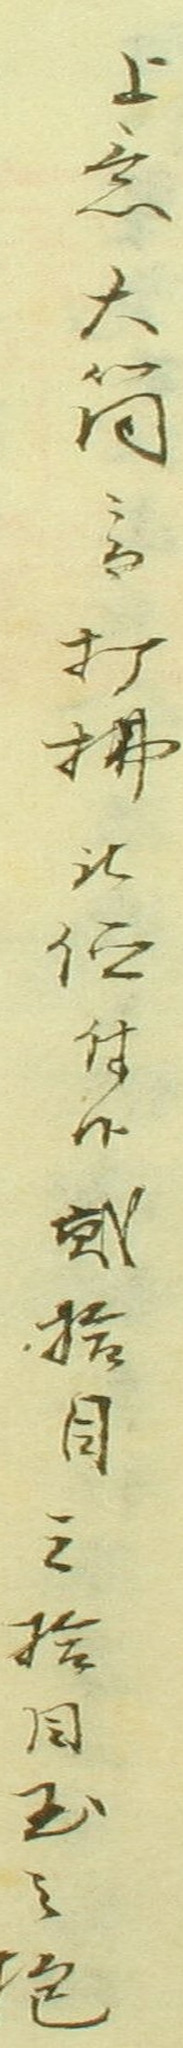上意大筒ニ而打払被仰付候弐拾目三拾目玉之抱
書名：唐船漂流記 二
